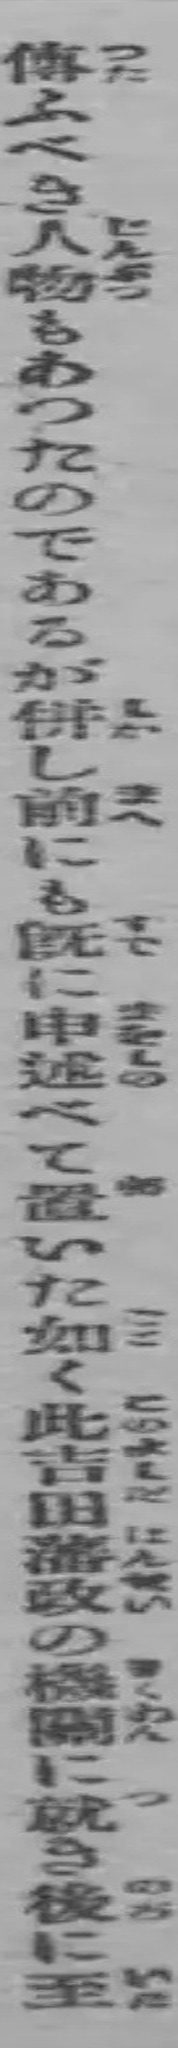伝ふべき人物もあつたのであるが併し前にも既に申述べて置いた如く此吉田藩政の機関に就き後に至
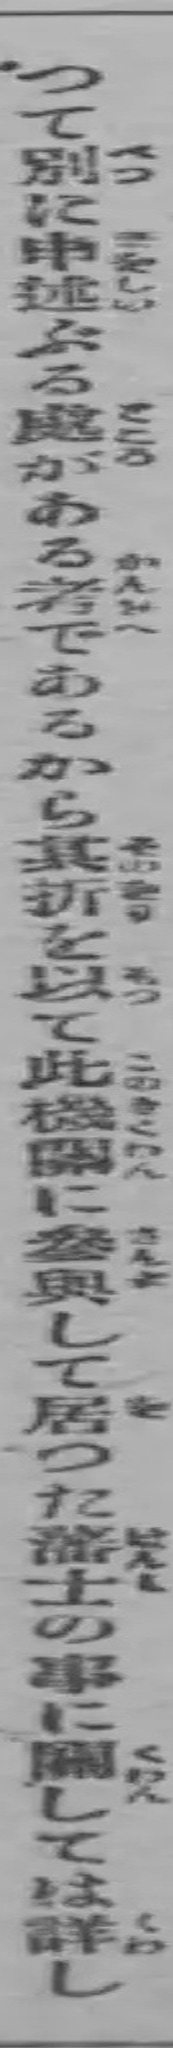つて別に申述ぶる処がある考であるから其折を以て此機関に参与して居つた藩士の事に関しては詳し
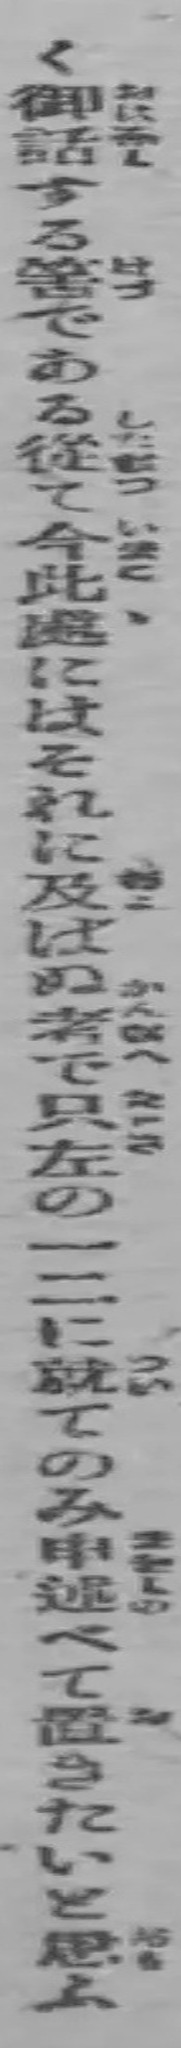く御話する筈である従て今此処にはそれに及ばぬ考で只左の一二に就てのみ申述べて置きたいと思ふ
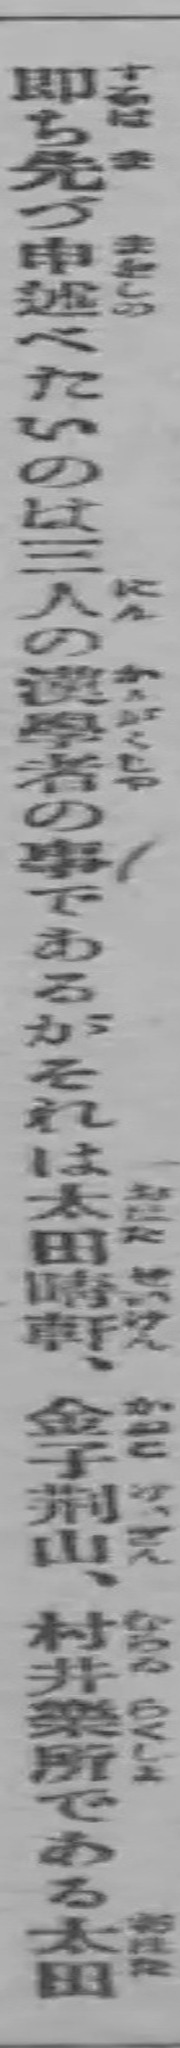太田晴軒即ち先づ申述べたいのは三人の漢学者の事であるがそれは太田晴軒、金子荊山、村井楽所である太田
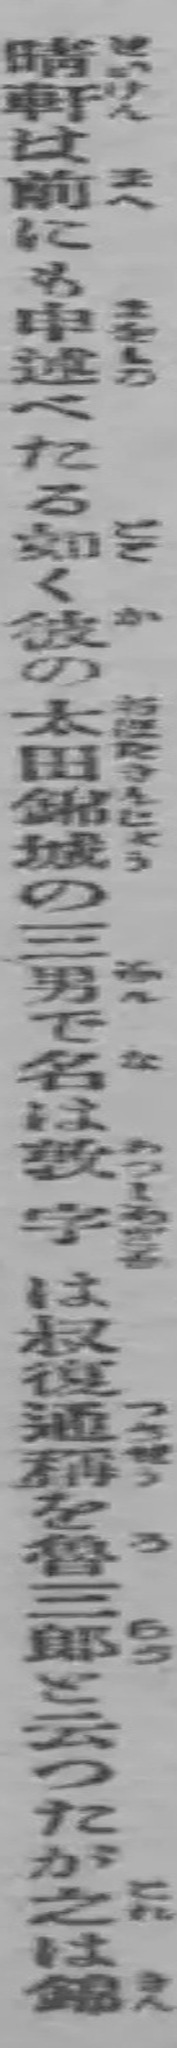金子荊山晴軒は前にも申述べたる如く彼の太田錦城の三男で名は敦字は叔復通称を魯三郎と云つたが之は錦
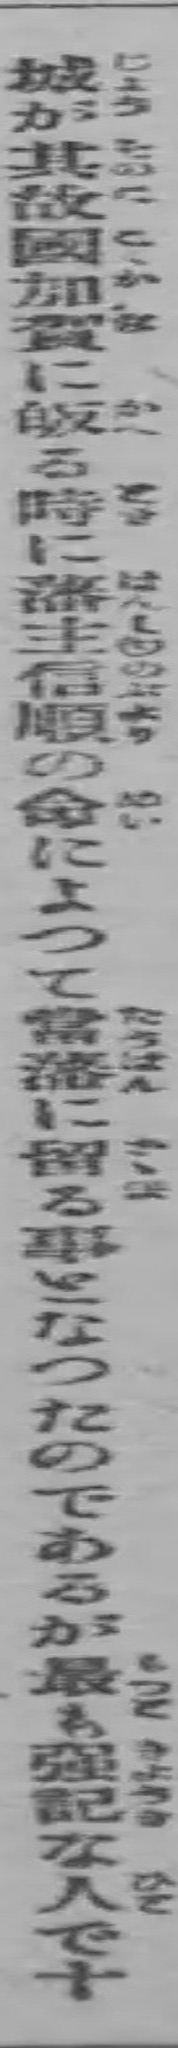村井楽所城が其故国加賀に皈る時に藩主信順の命によつて当藩に留る事となつたのでるが最も強記な人で十
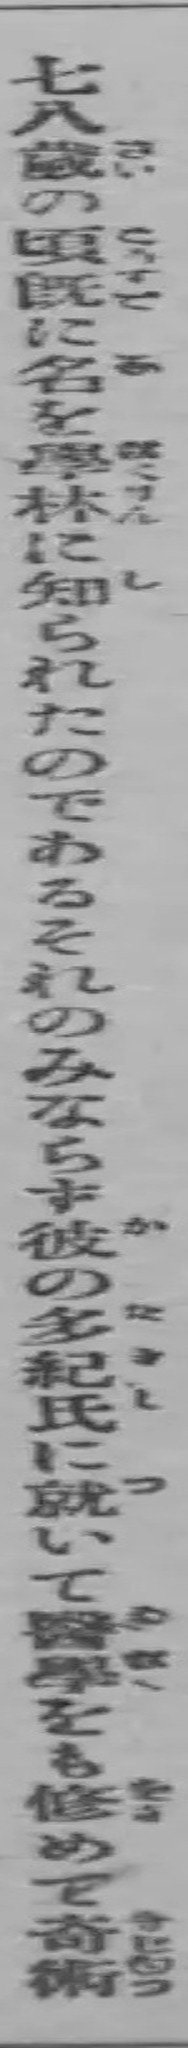七八歳の頃既に名を学林に知られたのであるそれのみならず彼の多紀氏に就いて医学をも修めて奇術
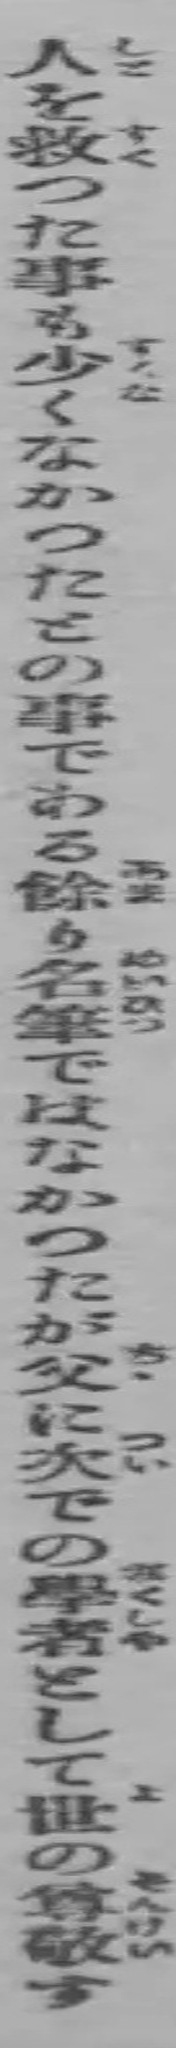人を救つた事も少くなかつたとの事である余り名筆ではなかつたが父に次での学者として世の尊敬す
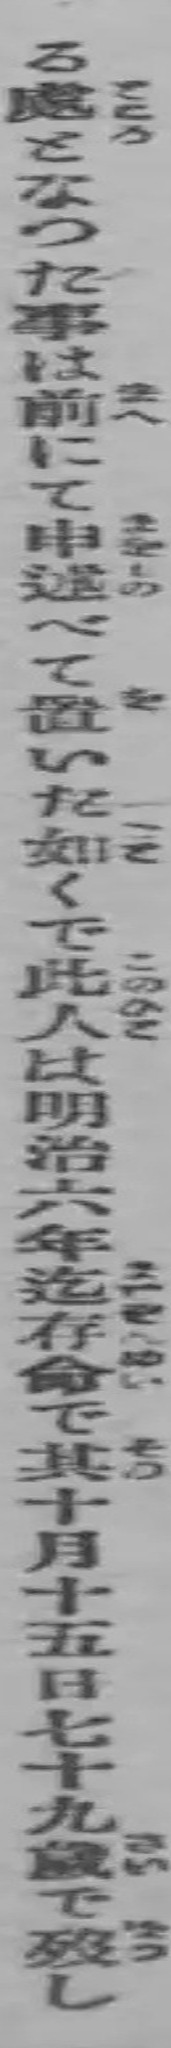る処となつた事は前にて申述べて置いた如くで此人は明治六年迄存命で其十月十五日七十九歳で歿し
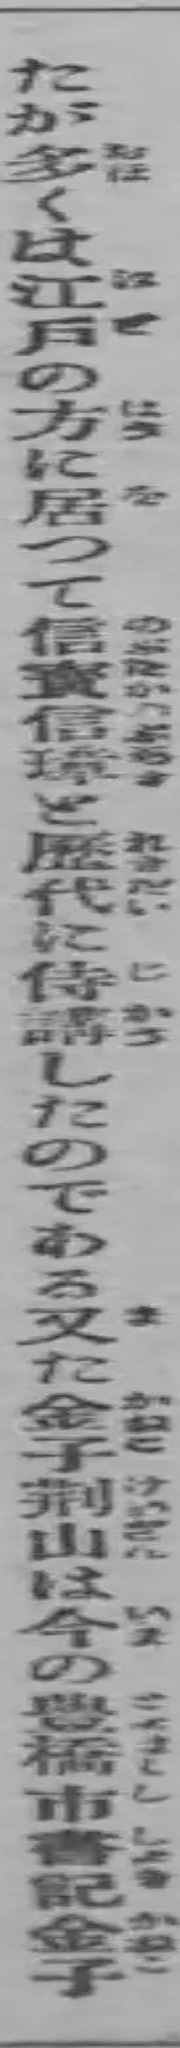たが多くは江戸の方に居つて信寶信璋と歴代に侍講したのである又た金子荊山は今の豊橋市書記金子
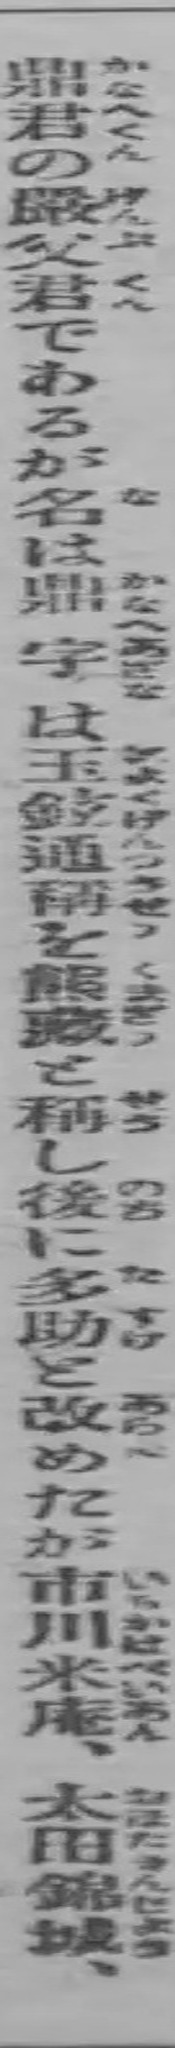鼎君の厳父君であるが名は鼎字は玉鉉通称を熊藏と称し後に多助と改めたが市川米庵、太田錦城、
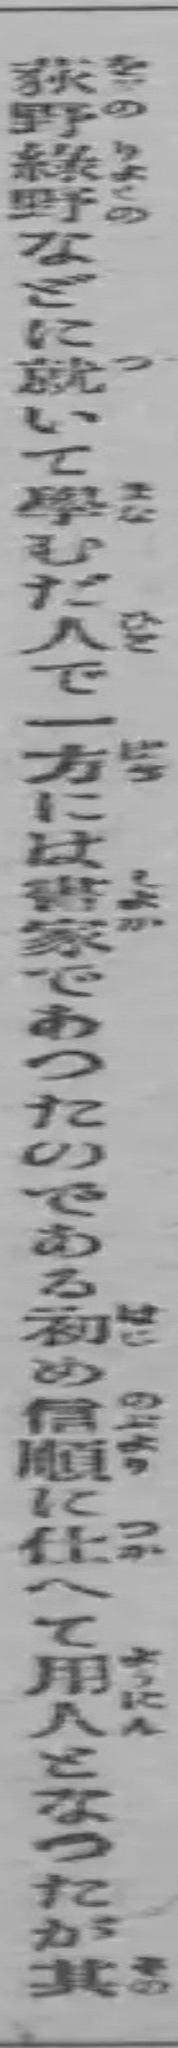荻野緑野などに就いて学むだ人で一方には書家であつたのである初め信順に仕へて用人となつたが其
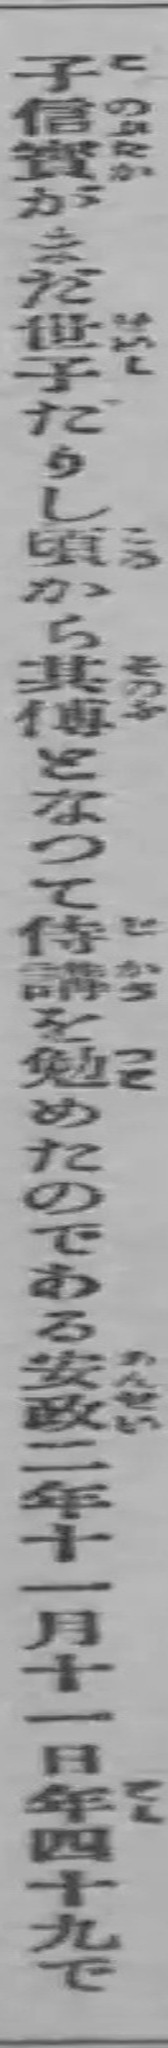子信寶がまだ世子たりし頃から其傅となつて侍講を勉めたのである安政二年十一月十一日年四十九で
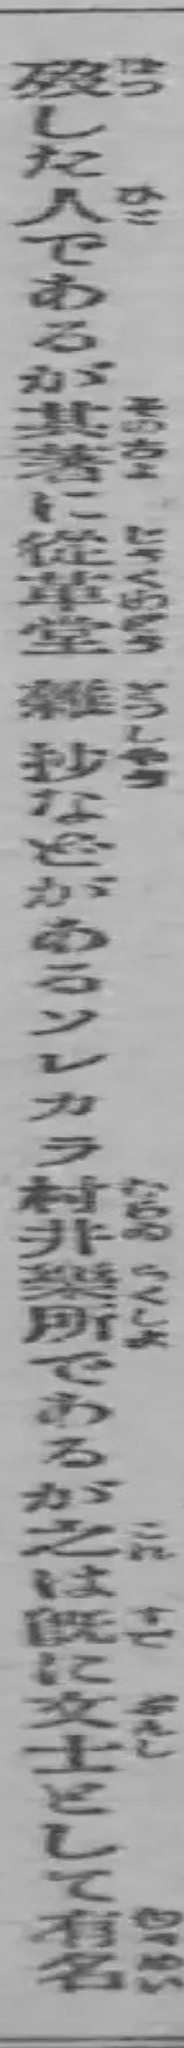歿した人であるが其著に従革堂雑抄などがあるソレカラ村井楽所であるが之は既に文士として有名
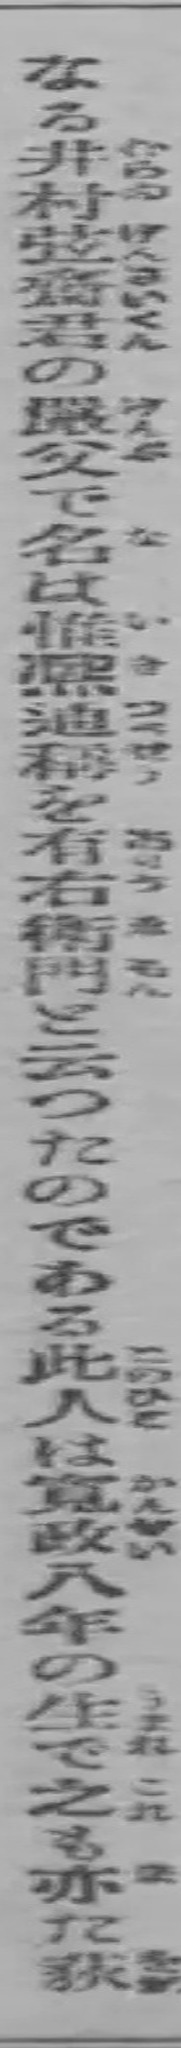なる村井弦斉君の厳父で名は惟凞通称を有右衛門と云つたのである此人は寛政八年の生で之も亦た荻
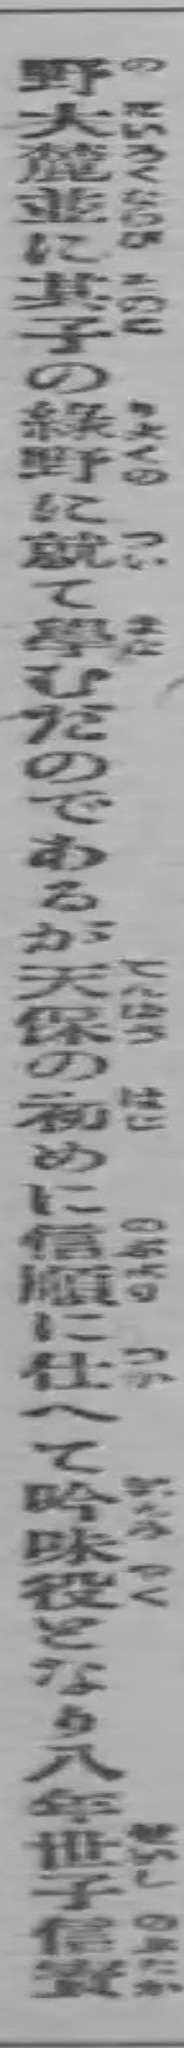野大麓並に其子の緑野に就て学むだのであるが天保の初めに信順に仕へて吟味役となり八年世子信寶
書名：豊橋市史談
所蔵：国立国会図書館 National Diet Library, JAPAN
